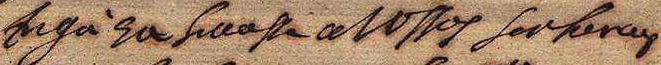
trega E a Leuasse a Vossas Senhorias
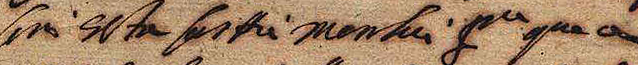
Com Esta Cartta minha pa que a
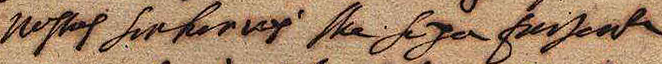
uossas Senhorias lhe seya perzente
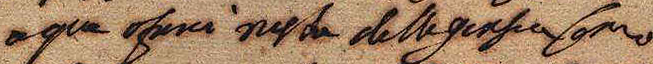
o que o fara nesta dellegensia Como
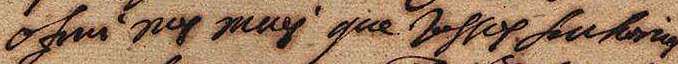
o farei nas maes que Vossa Senhorias
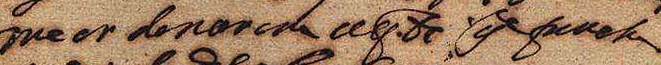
me ordenarem a q̄ ds̄ gde peniche
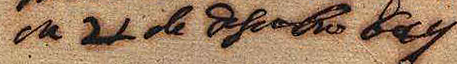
oie 21 de desenbro 647
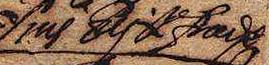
Luis Tejxa fraco
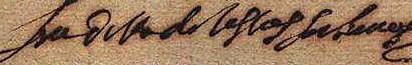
suditto de Vossas Senhorias
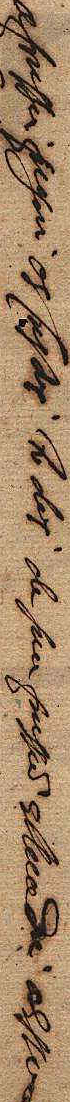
a pressa pagou os Custos todos de sua prissão E lleuada a Essa
